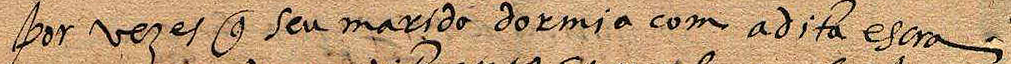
por vezes q̄ seu marido dormia com a ditā escra
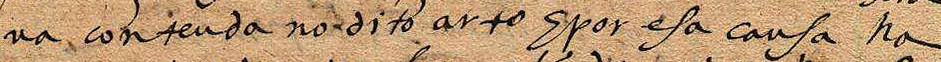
ua conteuda no ditō arto E por esa causa ha
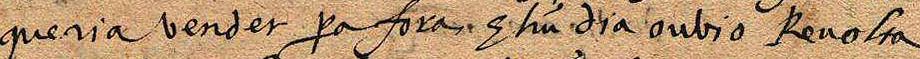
queria vender ꝑa fora E hū dia ouvio Reuolta
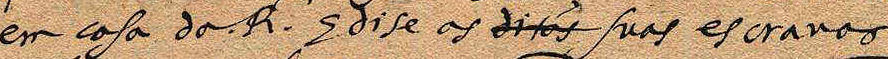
em casa da .R. e dise as ditas suas escrauas
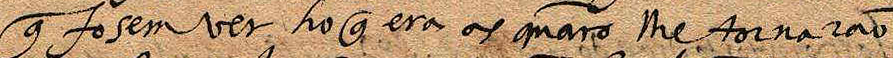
q̄ fosem ver ho q̄ era as qūaes lhe tornarão
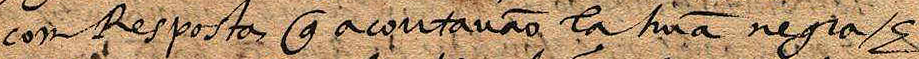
com Resposta q̄ acoutauão la huā negra / E
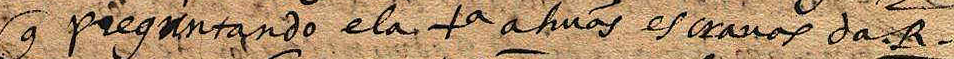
q̄ preguntando ela ta a huās escrauas da .R.
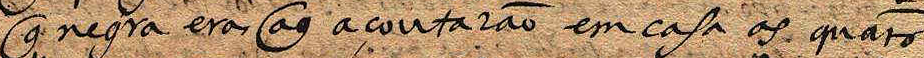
q̄ negra era a q̄ açoutarão em casa as quaēs
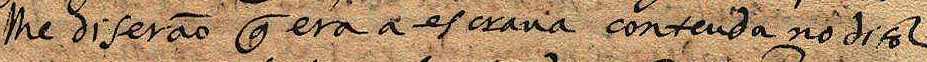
lhe diserão q̄ era a escraua conteuda no ditō
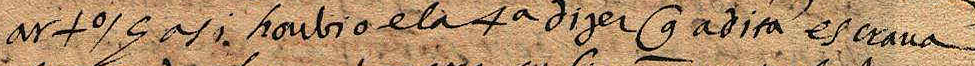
arto / E asi houvio ela ta dizer q̄ a ditā escraua
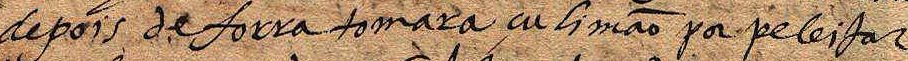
depois de forra tomara çulimão por peleiJar
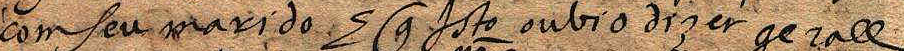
com seu marido E q̄ Jsto ouvio dizer gerall
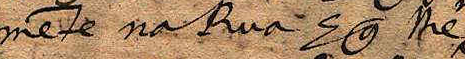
mēte na Rua E q̄ lhe
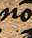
nō
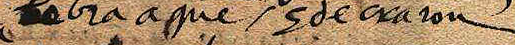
lēbra a quē / E decrarou
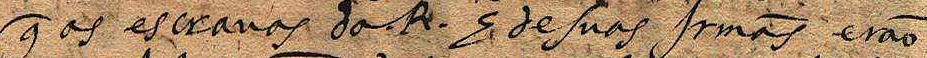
q̄ as escrauas da .R. E de suas Jrmās erão
